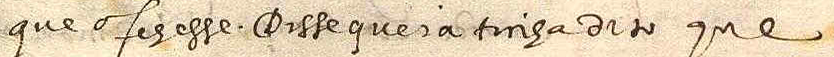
que o fezesse. Disse que ia tinha dito que
